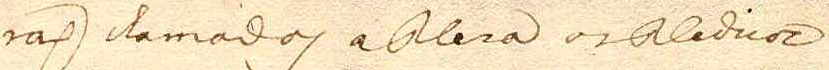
raõ chamados a Meza os Medicos
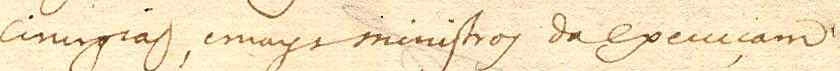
cirurgiaõ, e mays ministros da execuçam
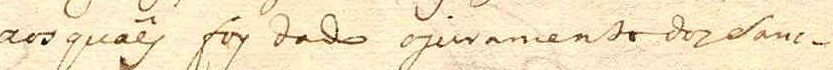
aos quaês foy dado o juramento dos Sanc
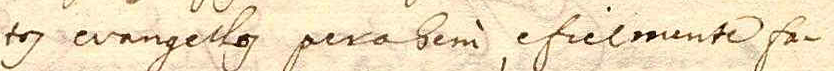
tos evangelhos pera bem, e fielmente fa
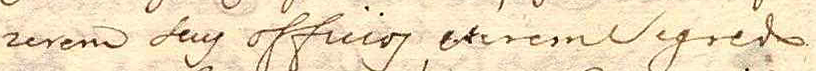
zerem seus officios, e terem Segredo
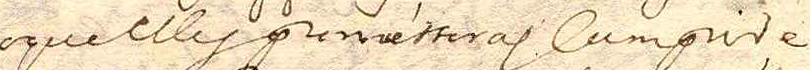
o que elles prometteraõ Cumprir, e
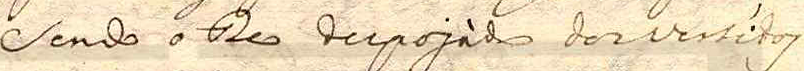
Sendo o Reo despojàdo dos vestidos
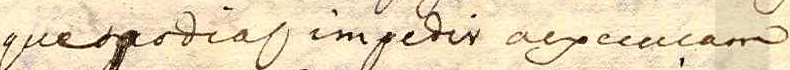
que podiaõ impedir a execuçam
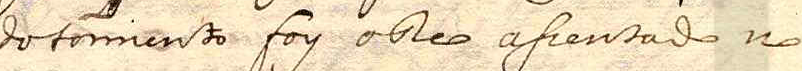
do tormento foy o Reo assentado no
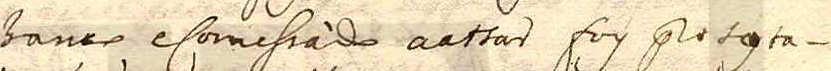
banco, e Comessàdo a attar foy protesta
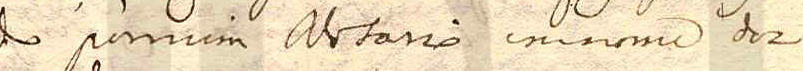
do por mim Notario em nome dos
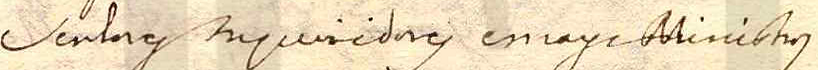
Senhores Inquisidores e mays Ministros
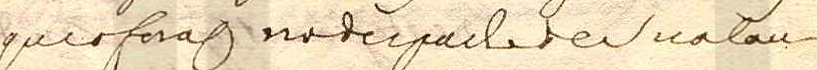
que o foraõ no despacho de Sua cau
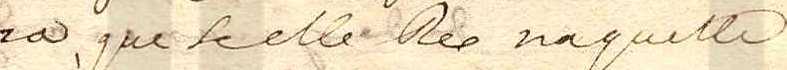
za, que se elle Reo naquelle
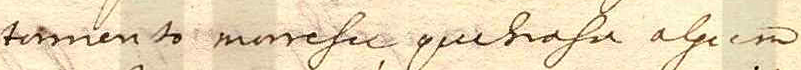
tormento morresse, quebrasse algum
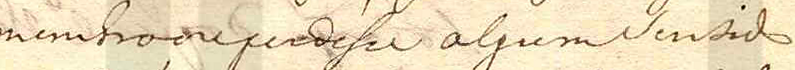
membro, ou perdesse algum Sentido
